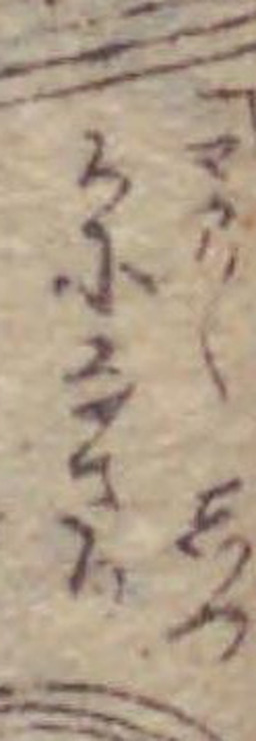かになさい
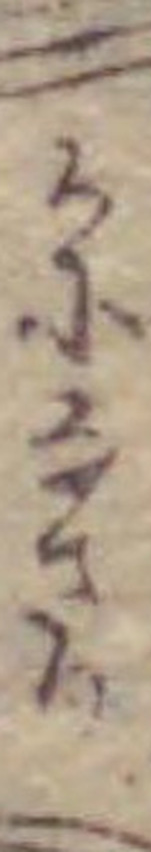かになさい
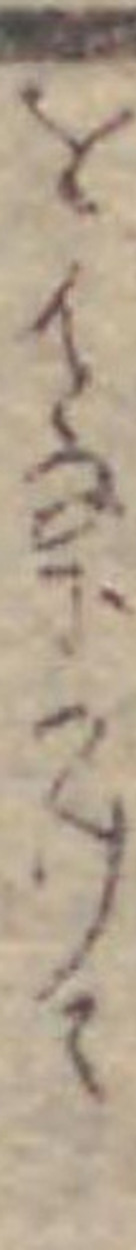をはなにつけて
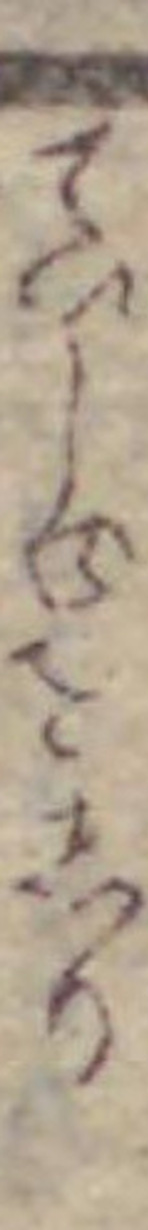ていしゆをしり
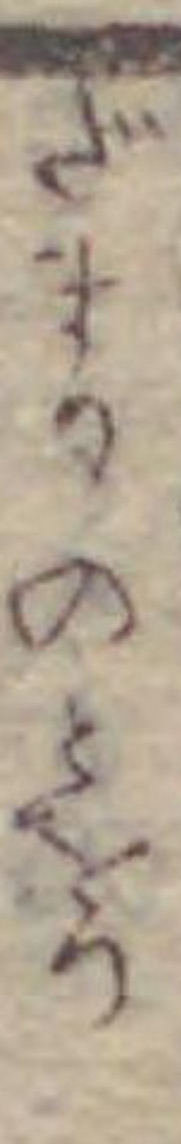だまりのとをり
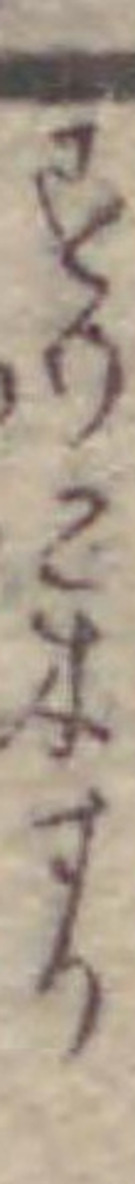すりこ木すり
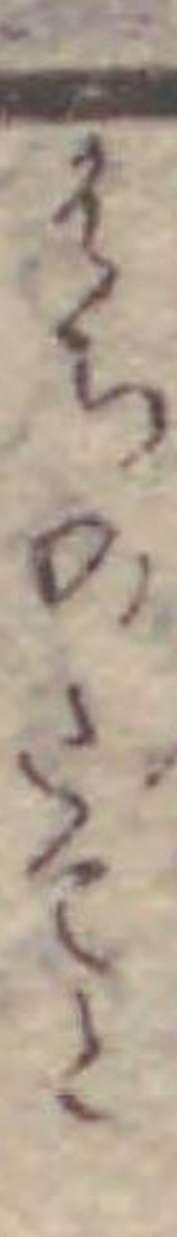はちのたてと
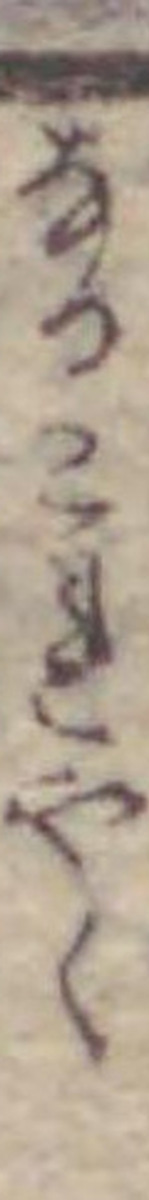なるこれやく
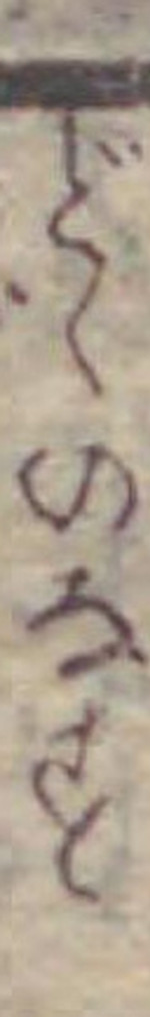どくのなす
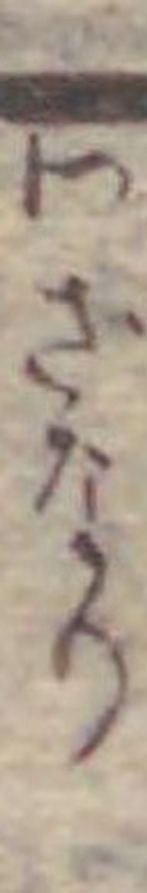わざなり
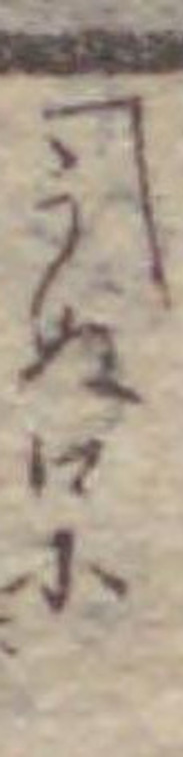〽うぬ口に
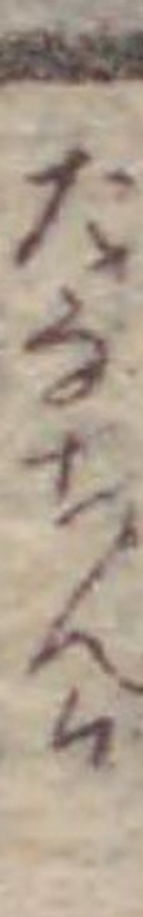たなちんが
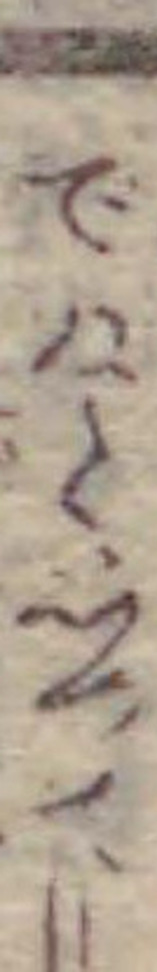でぬといつて
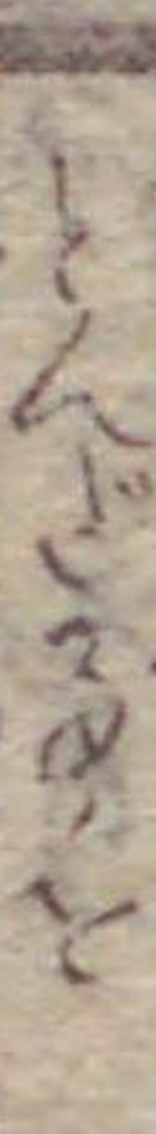とんだ事を
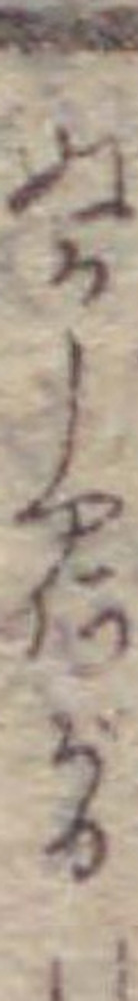ぬかしやあがる
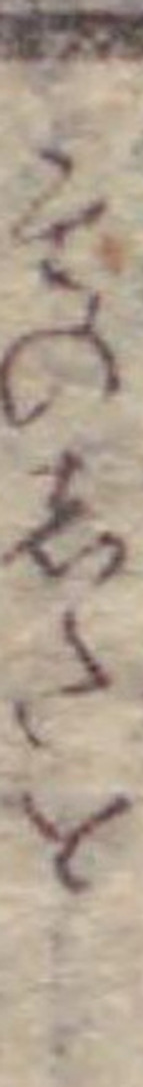そのしたを
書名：鼻下長生薬 : 3巻
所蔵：国立国会図書館 National Diet Library, JAPAN
